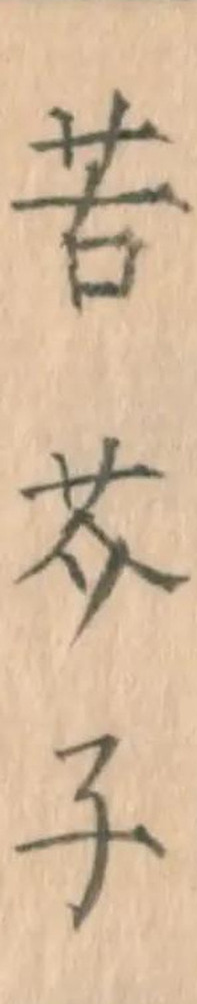苦芥子
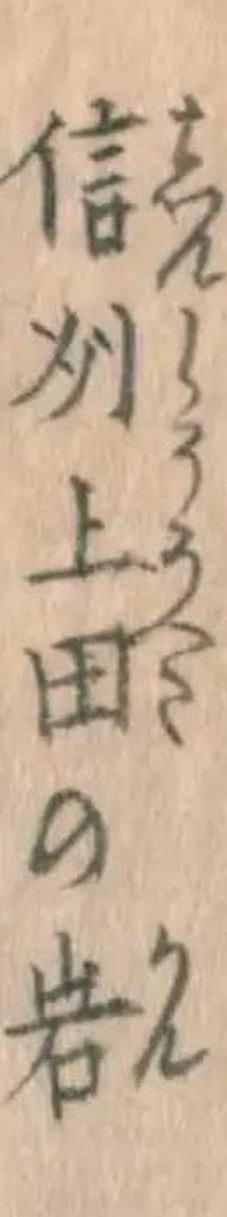信州上田の岩
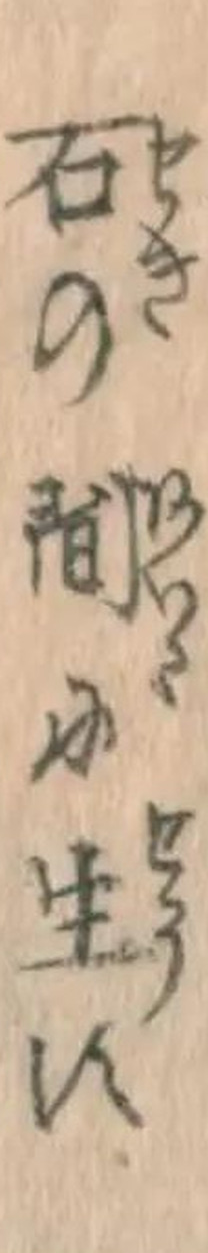石の間に生す
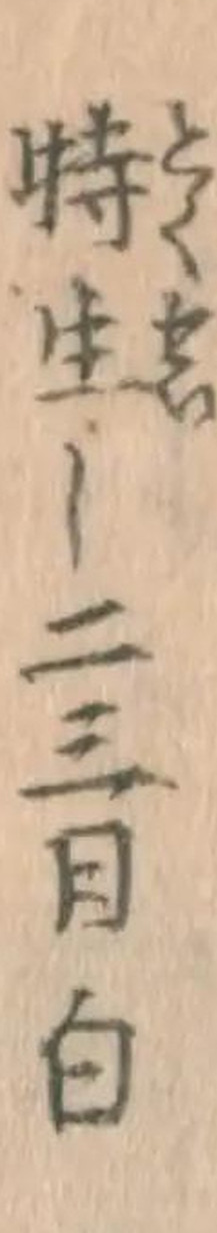特生し二三月白
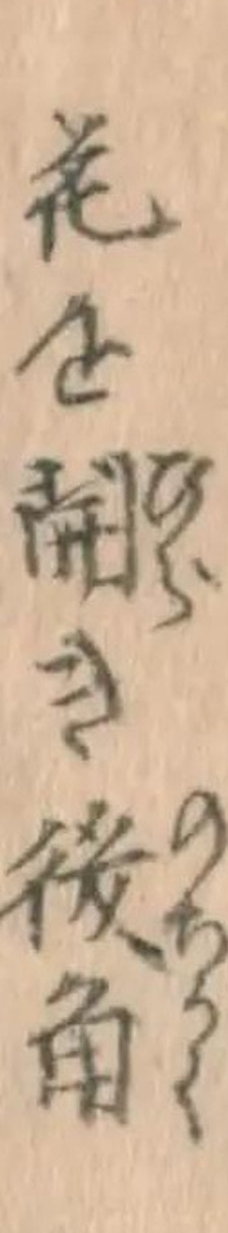花を開き後角
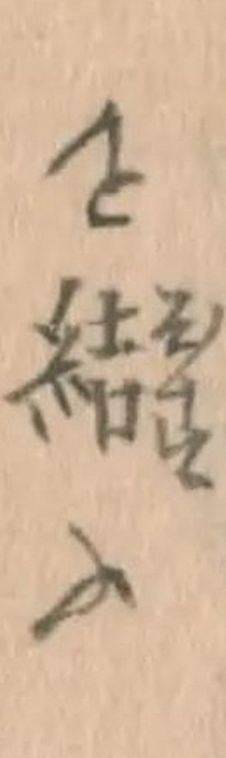を結ふ

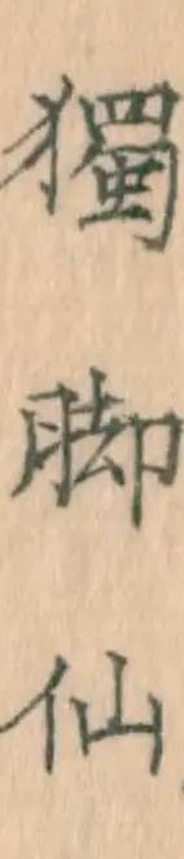独脚仙
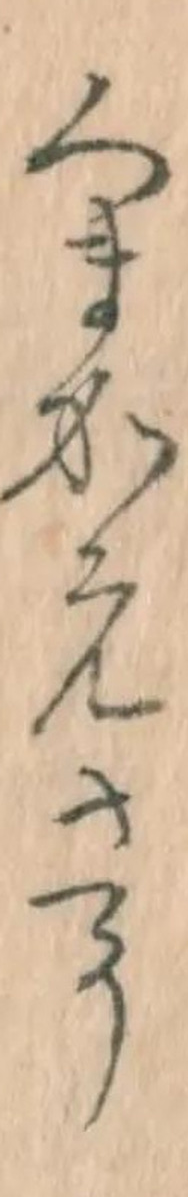くまかえさう
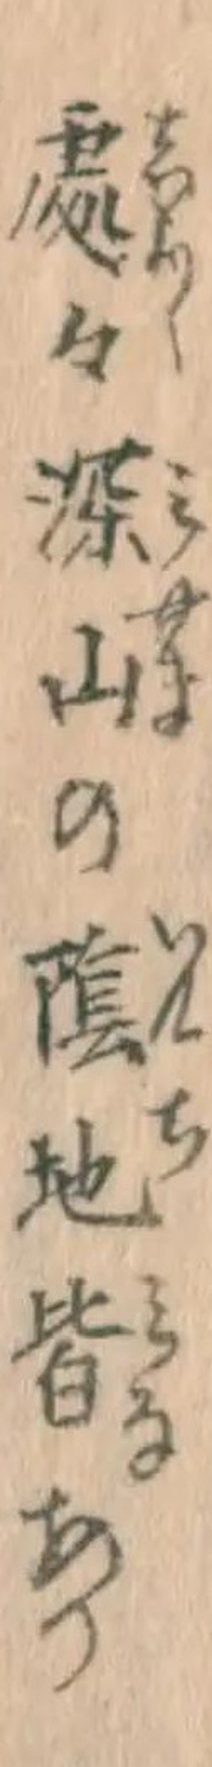処々深山の陰地皆あり
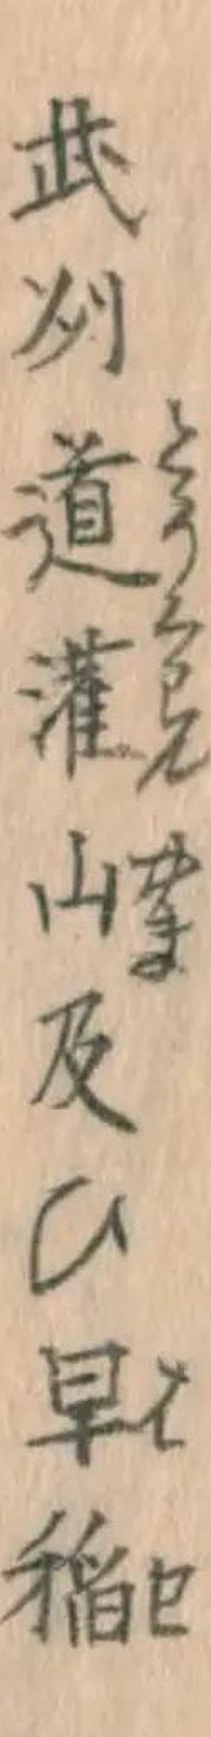武州道灌山及ひ早稲
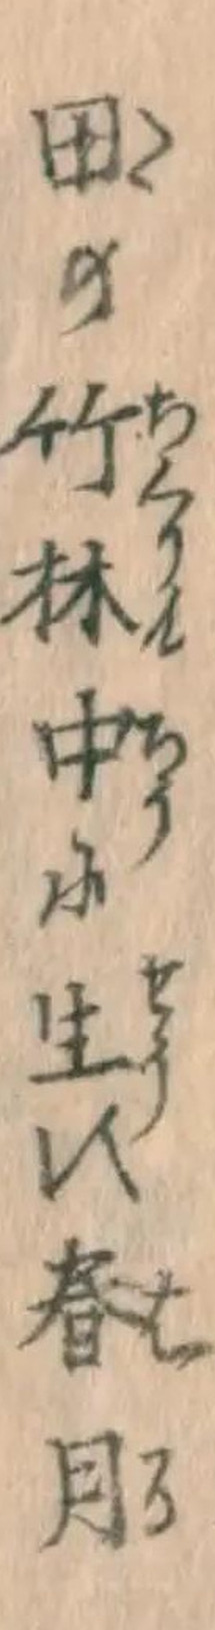田の竹林中に生す春月
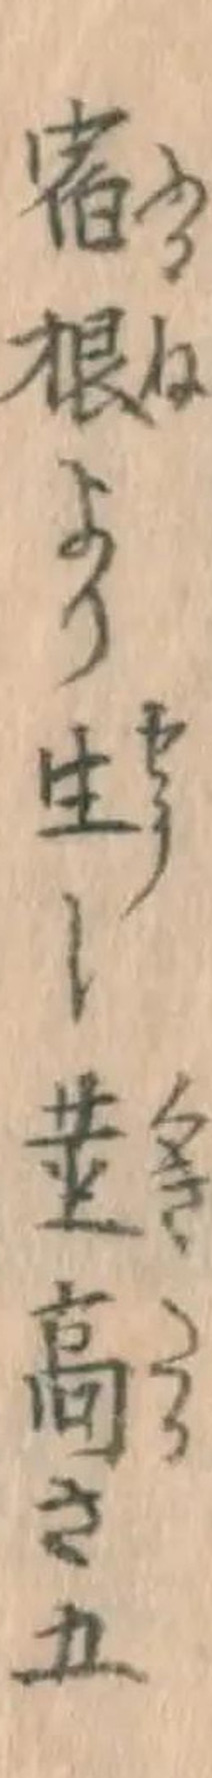宿根より生し茎高さ五
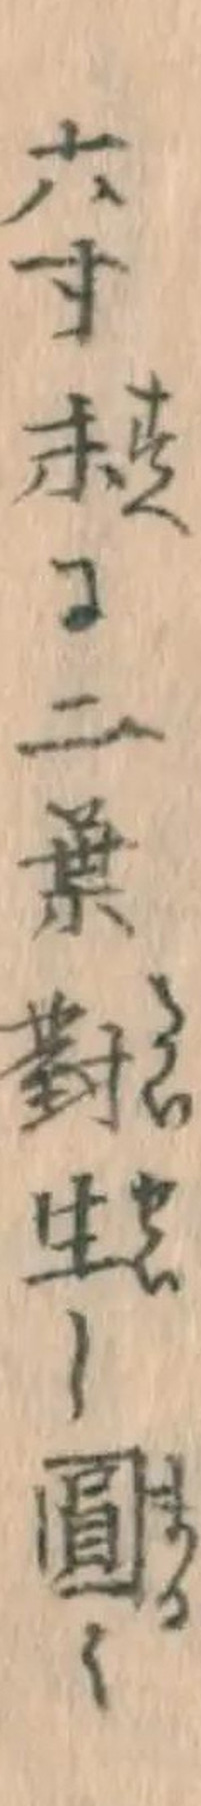六寸末に二葉対生し円く
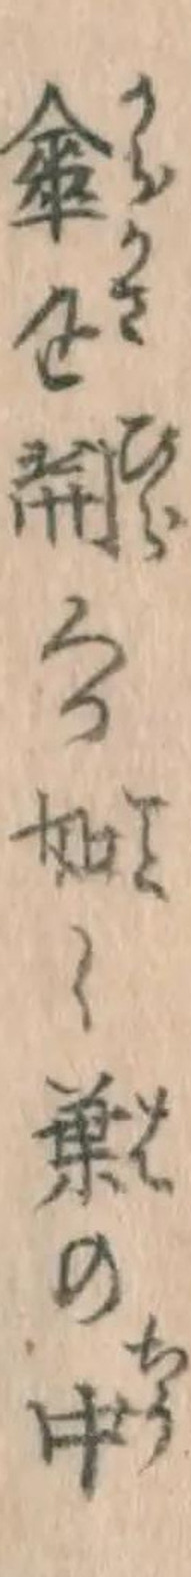傘を開くか如く葉の中
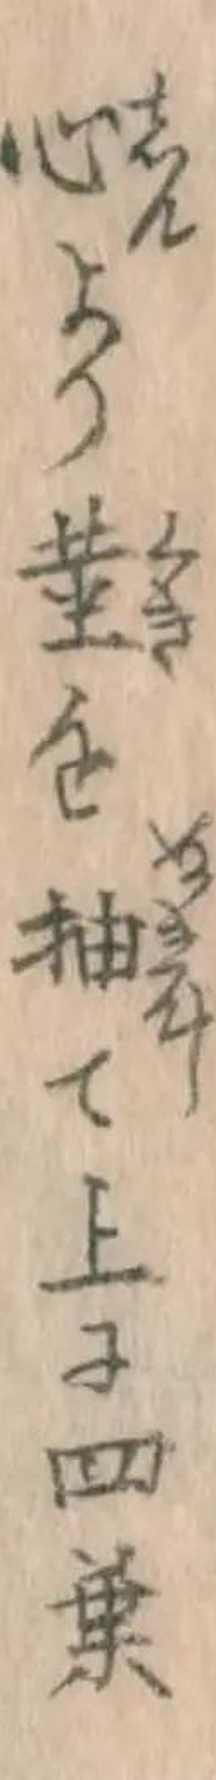心より茎を抽て上に四葉
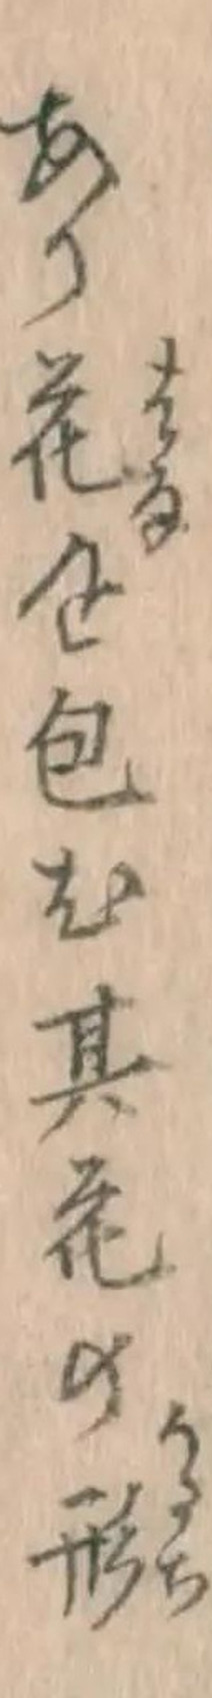あり花を包む其花の形
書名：本草図譜. 巻37-39
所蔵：国立国会図書館 National Diet Library, JAPAN
